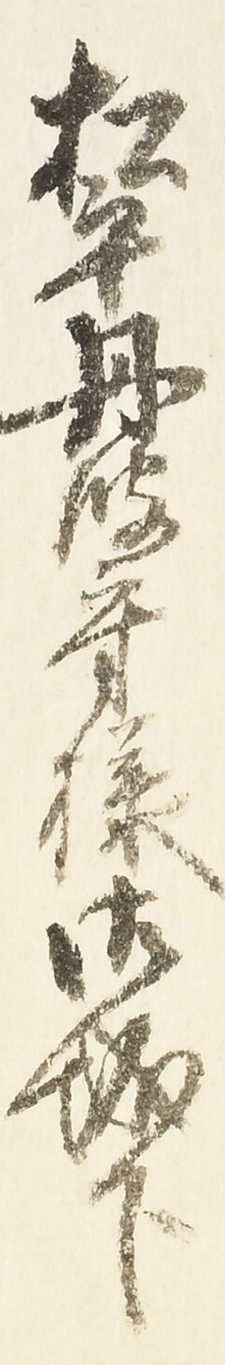松平丹波守様御城下
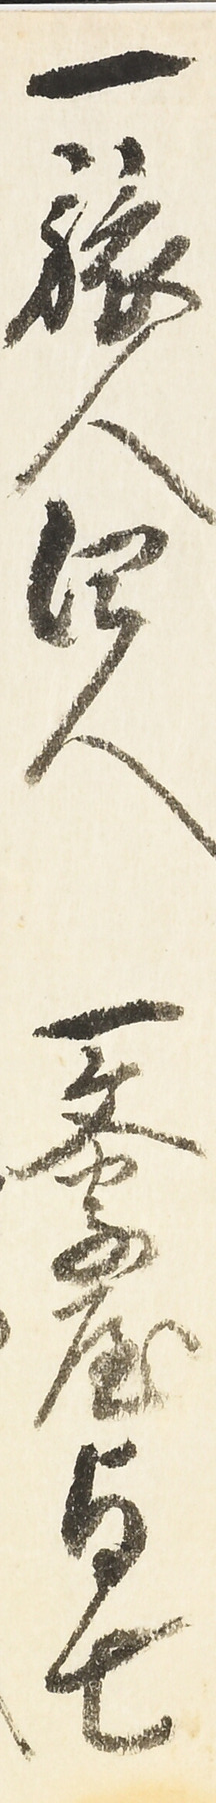一旅人四人一文字屋与七
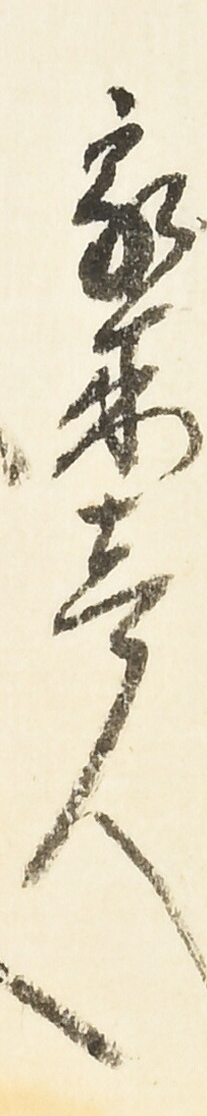家来壱人
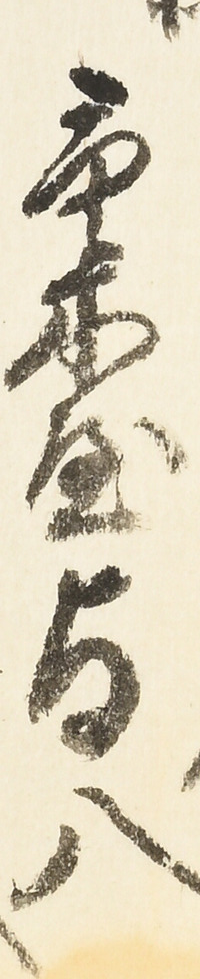唐木屋与八
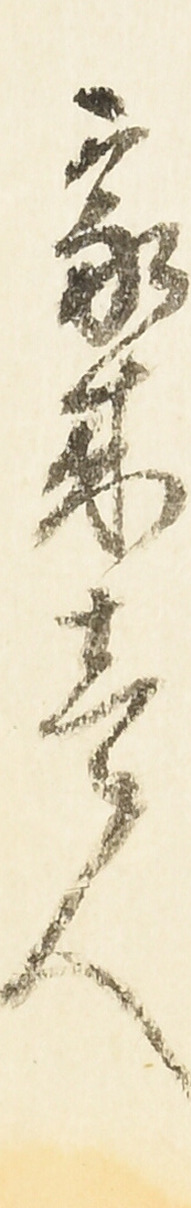家来壱人
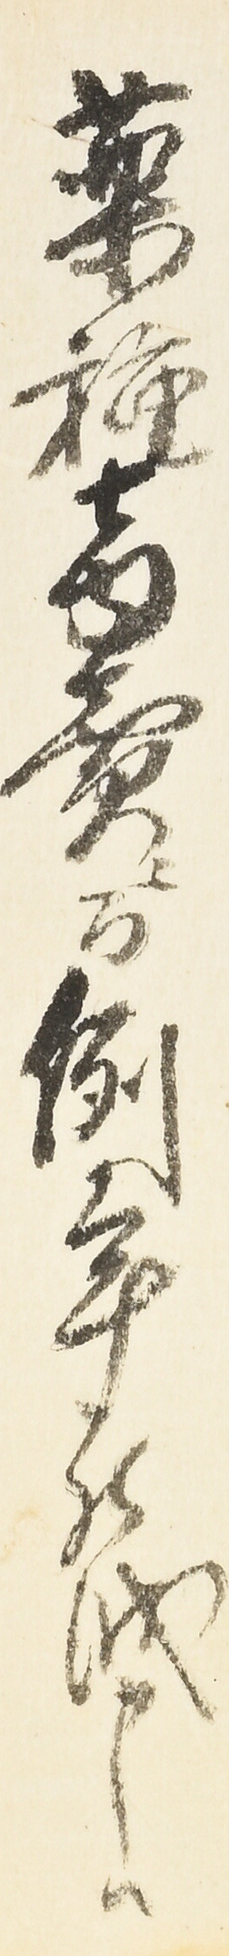薬種商売ニ而例年罷越申候
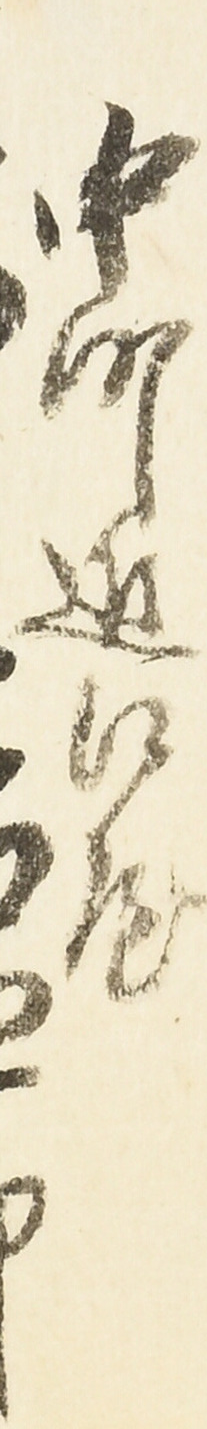中町近江屋
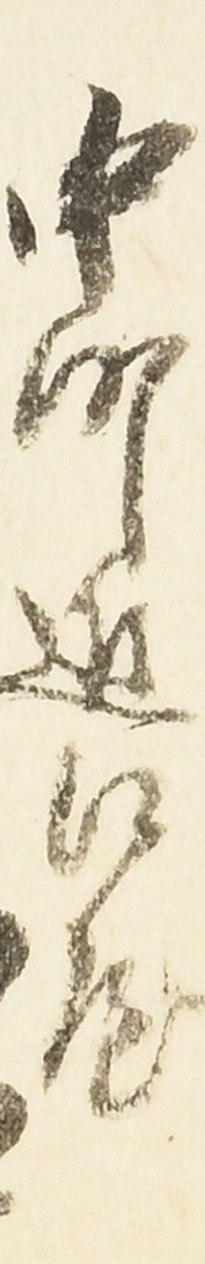中町近江屋
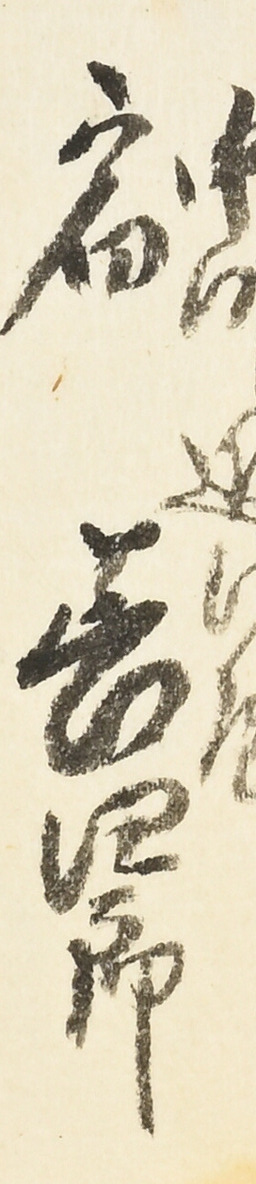宿善四郎
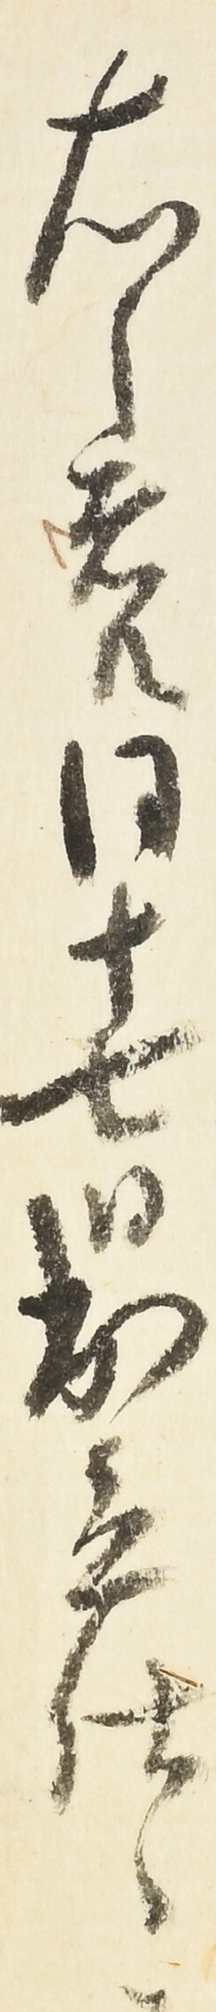右之者共同十七日出立仕候
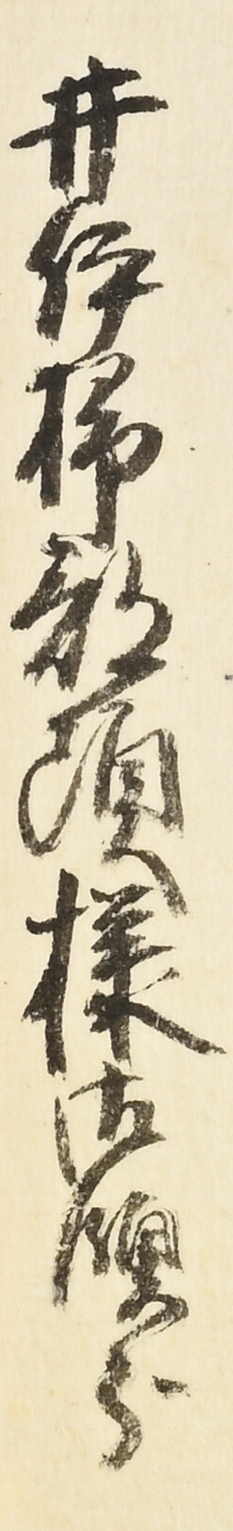井伊掃部頭様御領分
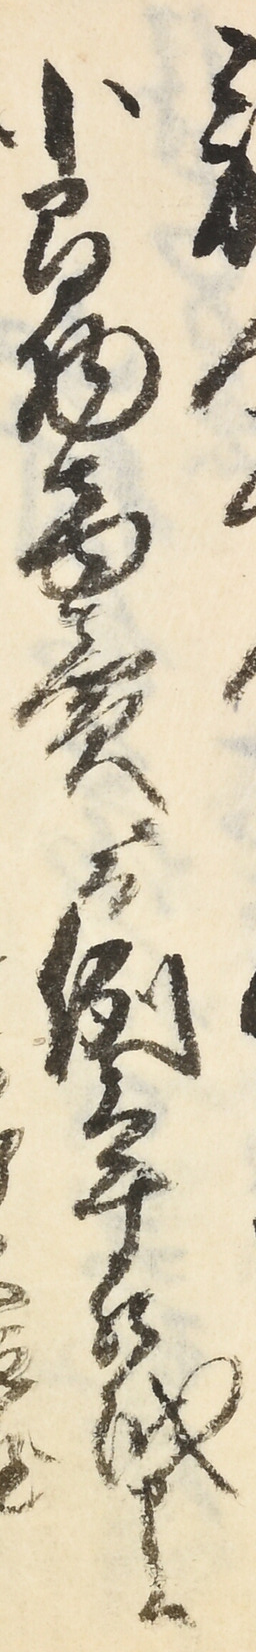小間物商売ニ而例年罷越申候

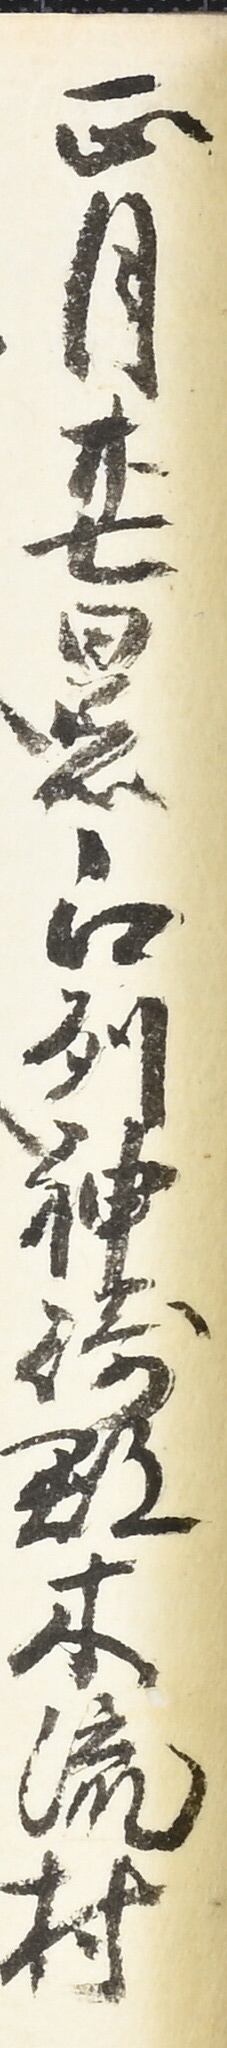正月廿七日着江州神崎郡木流村
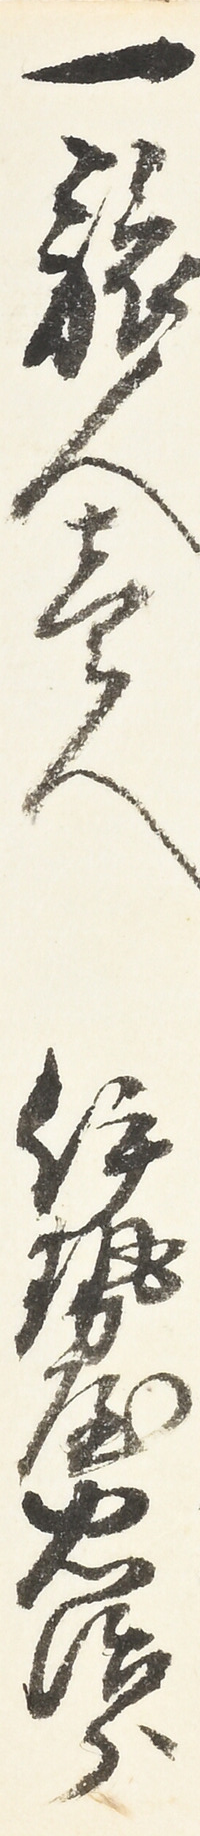一旅人壱人伊勢屋忠治郎
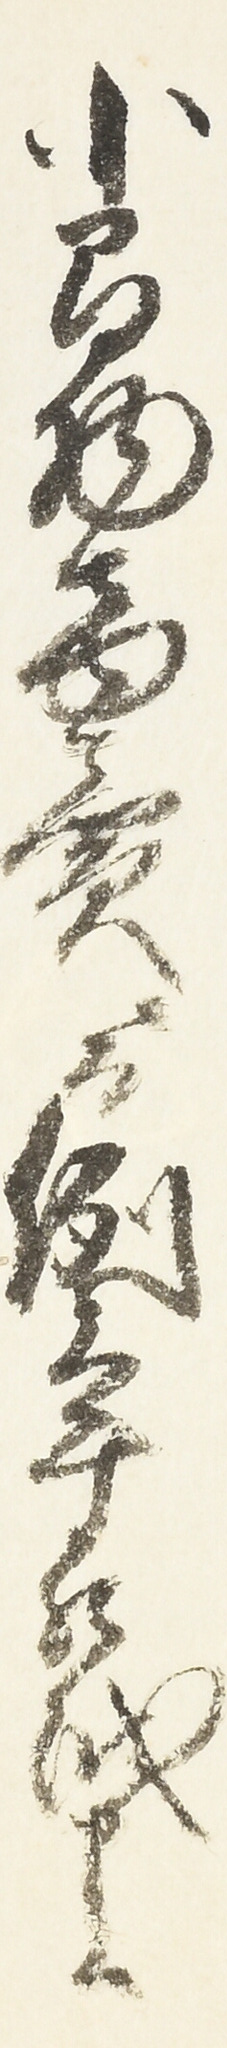小間物商売ニ而例年罷越申候
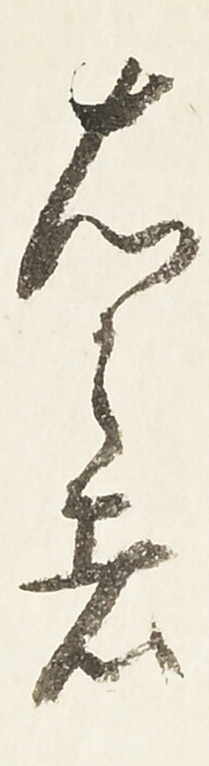右之者
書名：町中旅人泊控帳
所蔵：伊那市立高遠町図書館・合同会社AMANE
